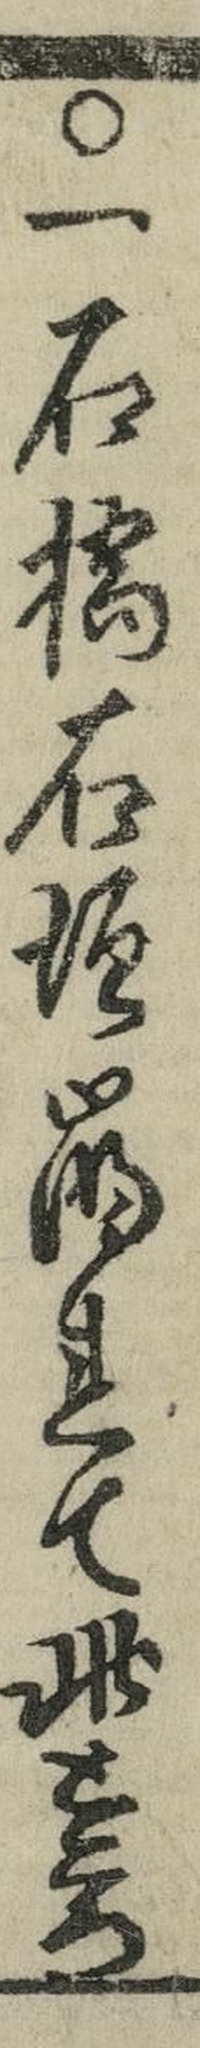○一石橋石垣崩れて此ところ
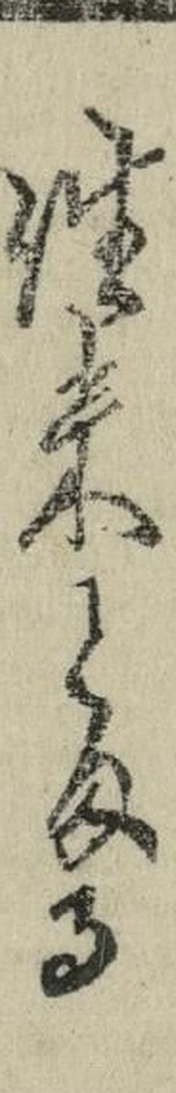往来とまる
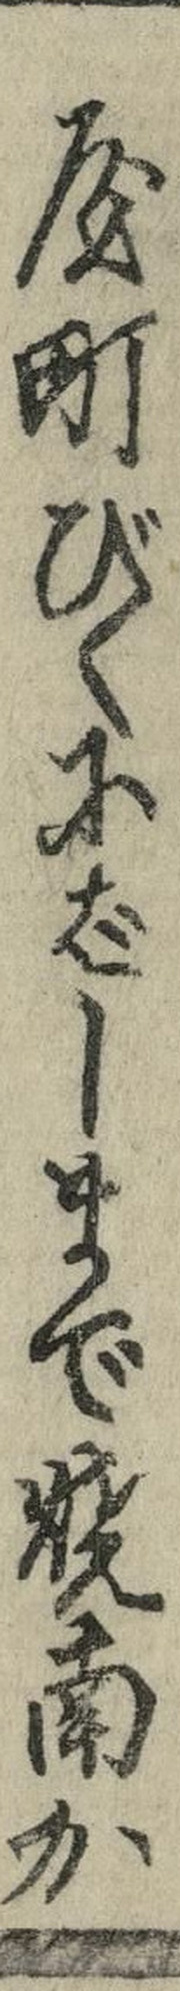屋町びくにばしまで焼南か
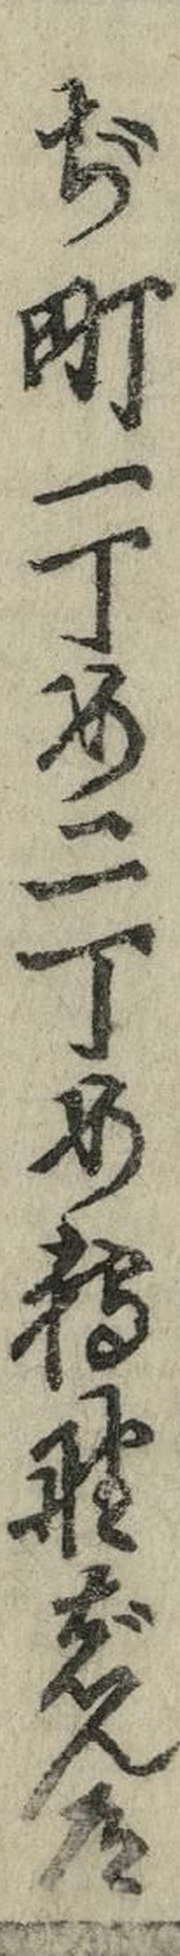ぢ町一丁め二丁め狩野じん道
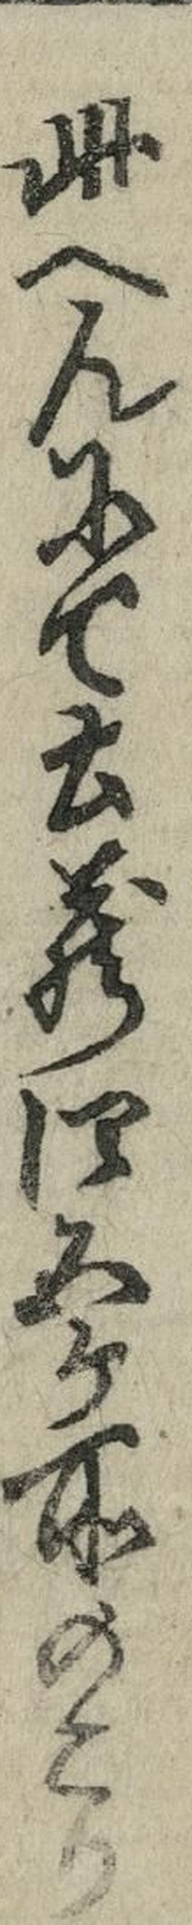此へんにて土蔵四五ヶ所のこり
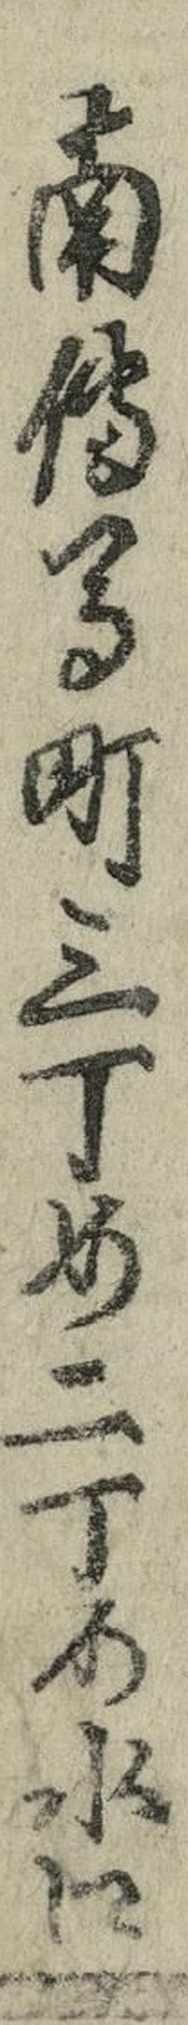南伝馬町三丁め二丁め水口
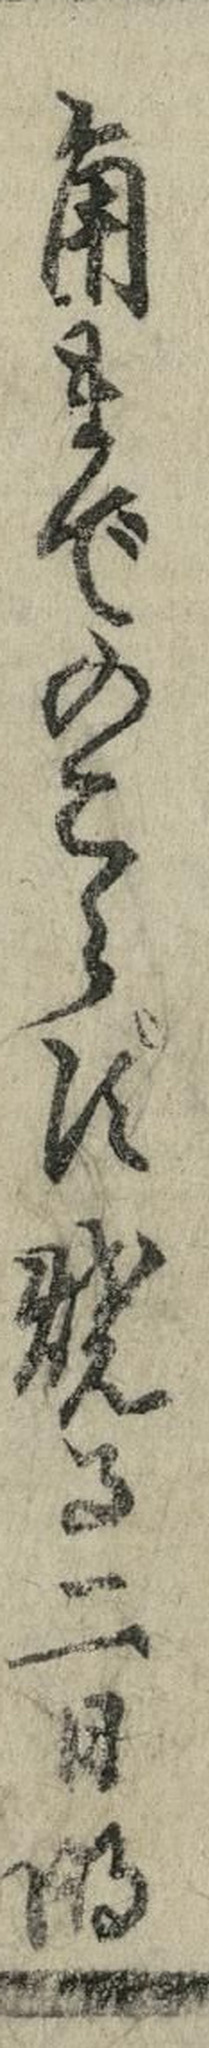南までのこらす焼る二日明
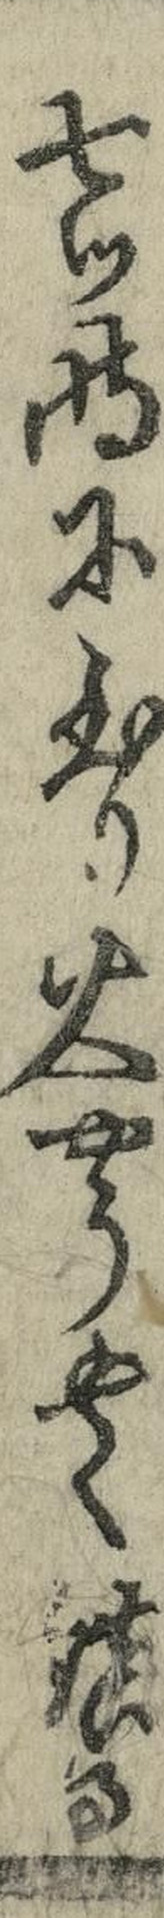七ツ時に至り火やうやく鎮る
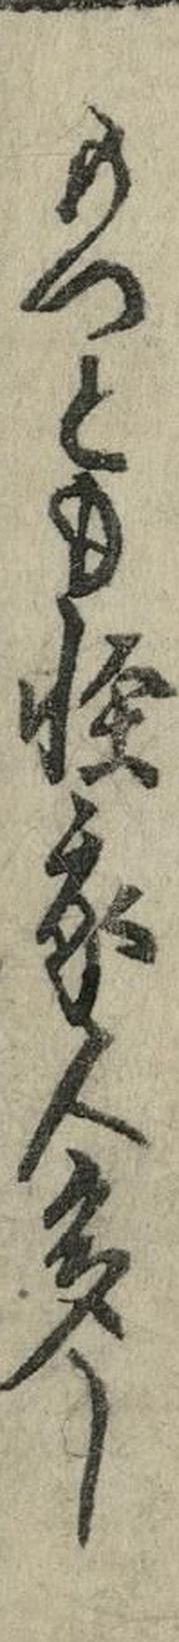もつとも怪我人多し

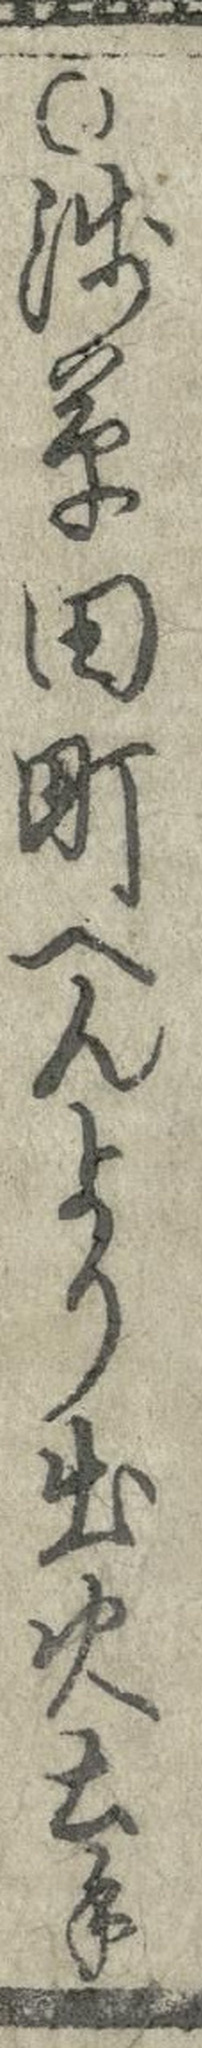○浅草田町へんより出火土手
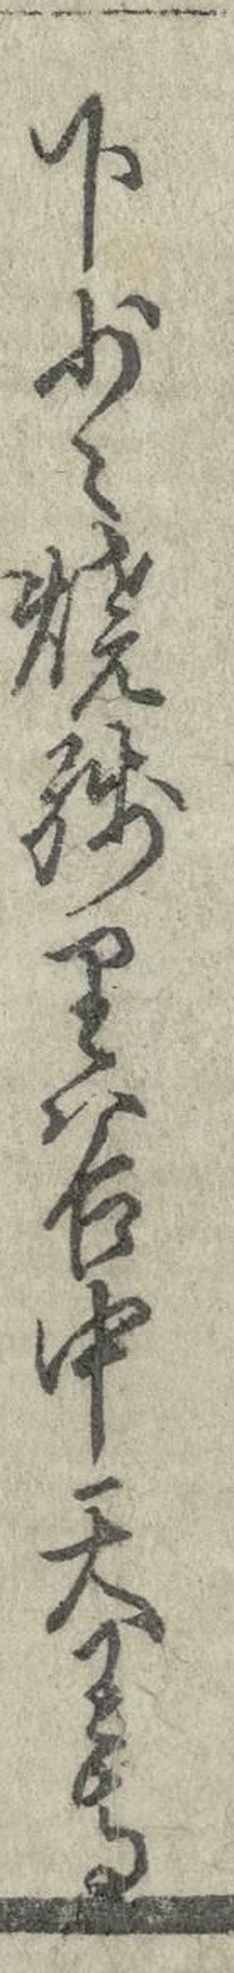下少々焼残り谷中天王寺
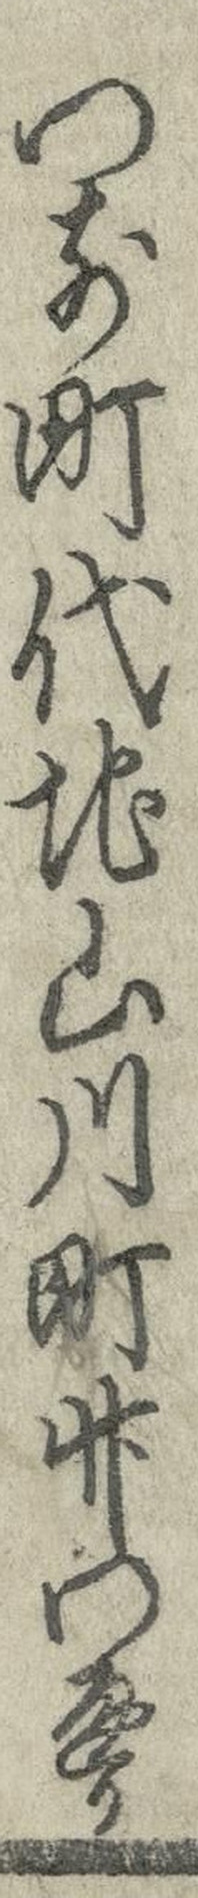門前町代地山川町竹門通り
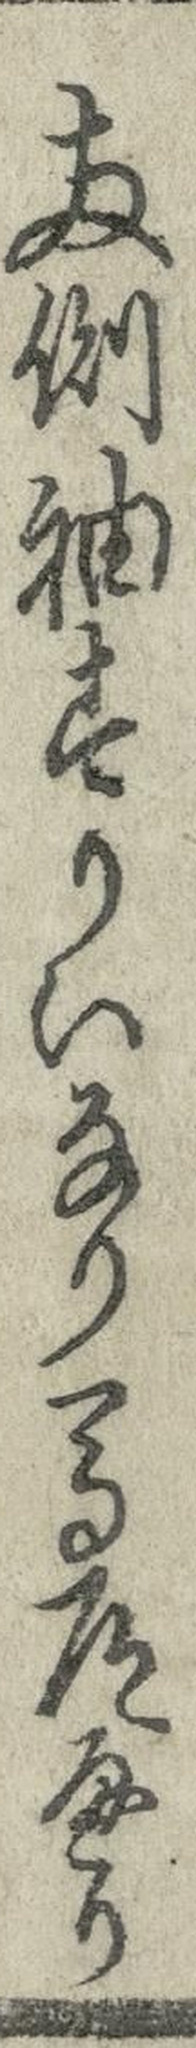両側袖すりいなり馬道通り
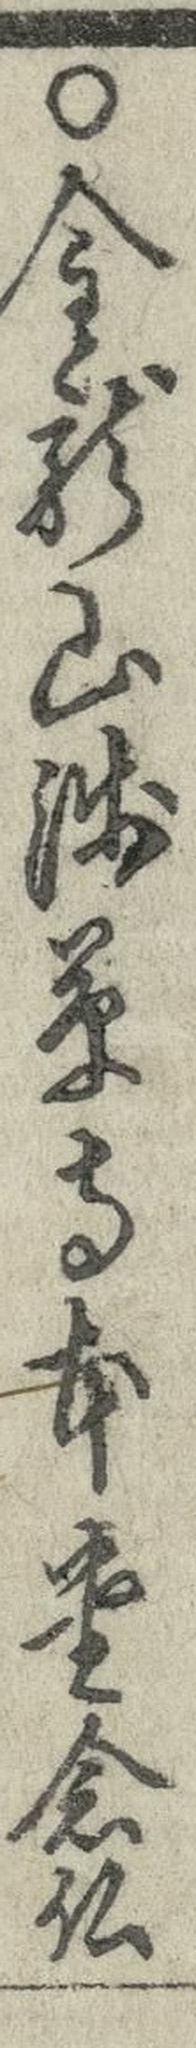○金龍山浅草寺本堂念仏
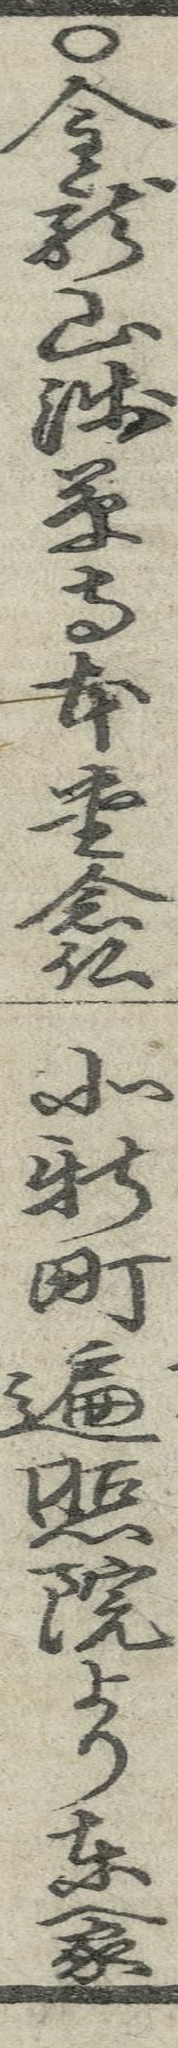○金龍山浅草寺本堂念仏
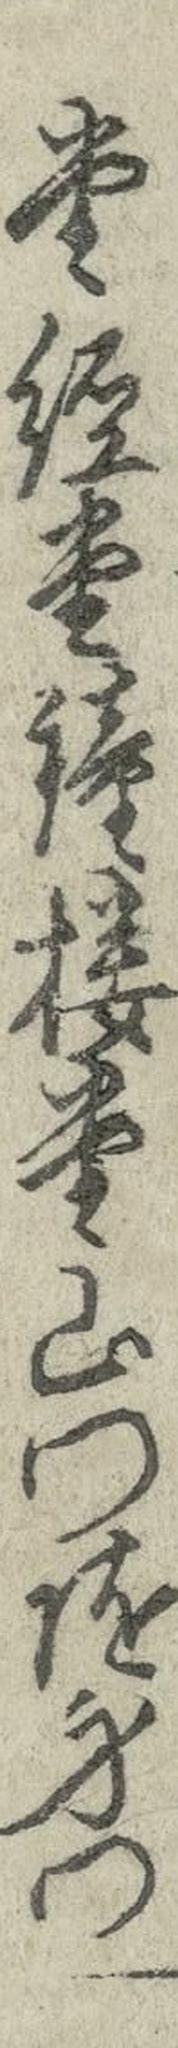堂経堂鐘楼堂山門随身門
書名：江戸　大地震末代噺の種　全
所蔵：東京大学地震研究所図書室 Earthquake Research Institute Library, The University of Tokyo, JAPAN
